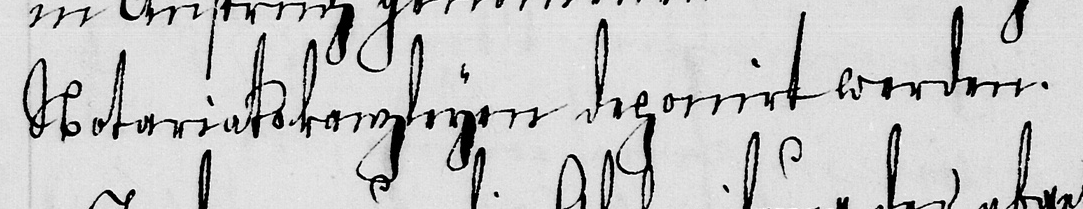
Notariatskanzleyen deponirt werden.
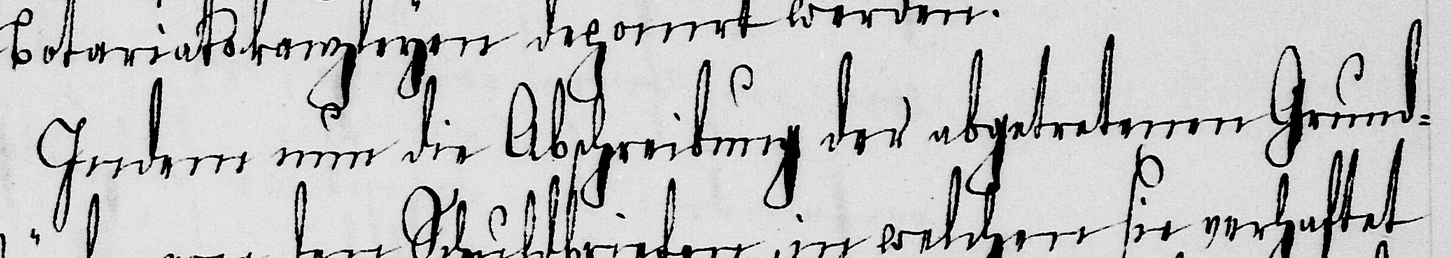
Indem nun die Abschreibung der abgetretenen Grund¬
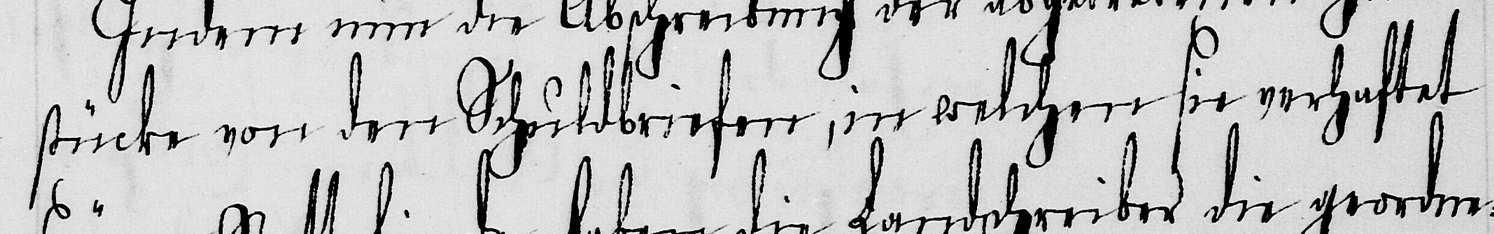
stücke von den Schuldbriefen, in welchen sie verhaftet
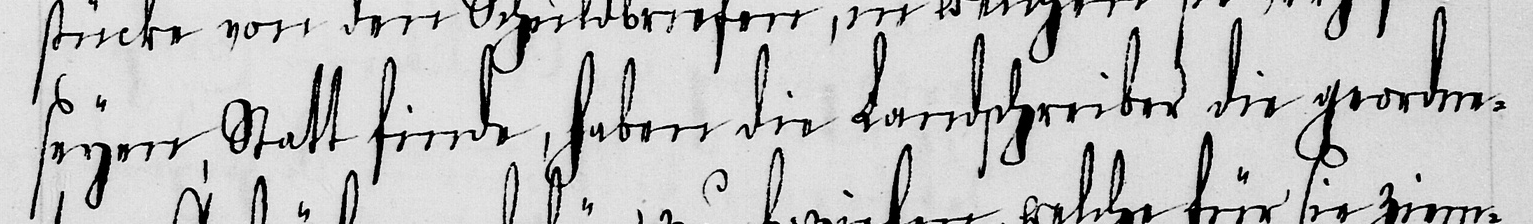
seyen, Statt finde, haben die Landschreiber die geordne¬
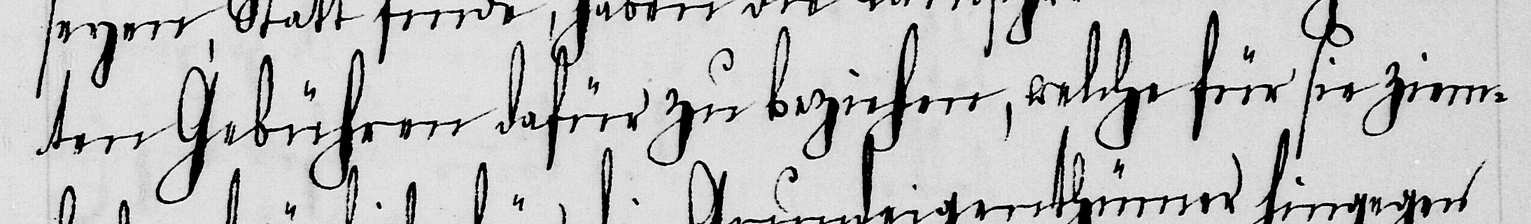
ten Gebühren dafür zu beziehen, welche für sie ziem¬
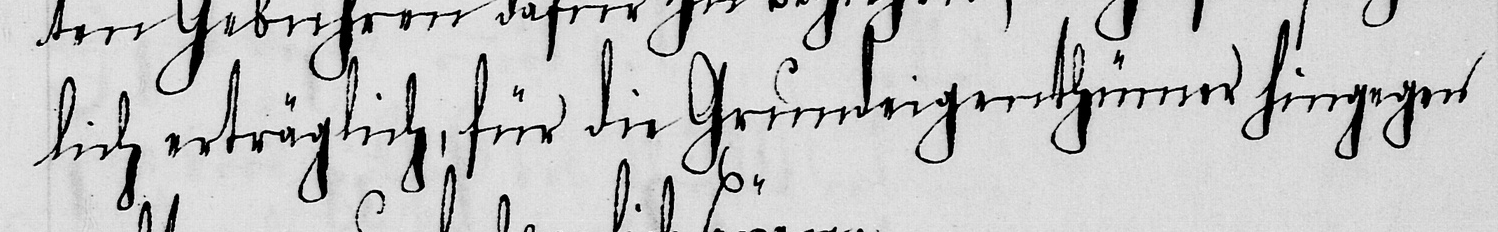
lich erträglich, für die Grundeigenthümer hingegen
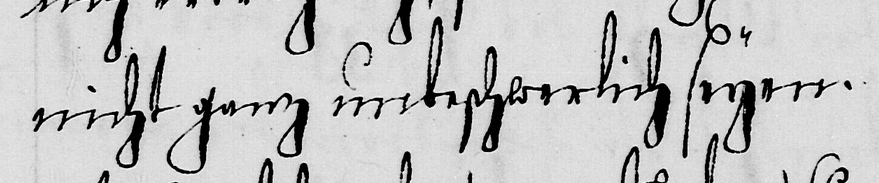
nicht ganz unbeschwerlich seyen.
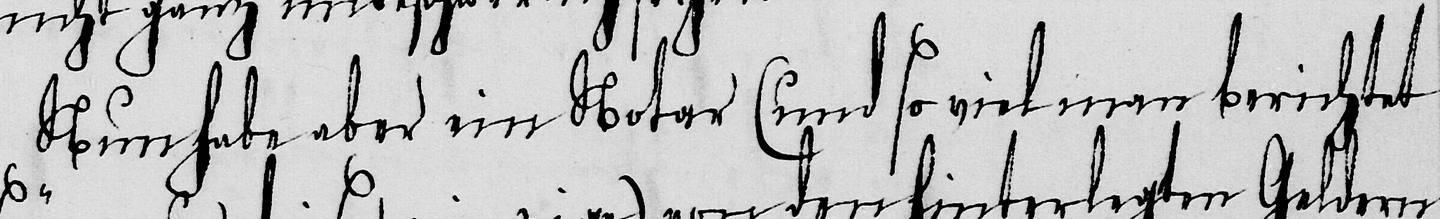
Nun habe aber ein Notar (und so viel man berichtet
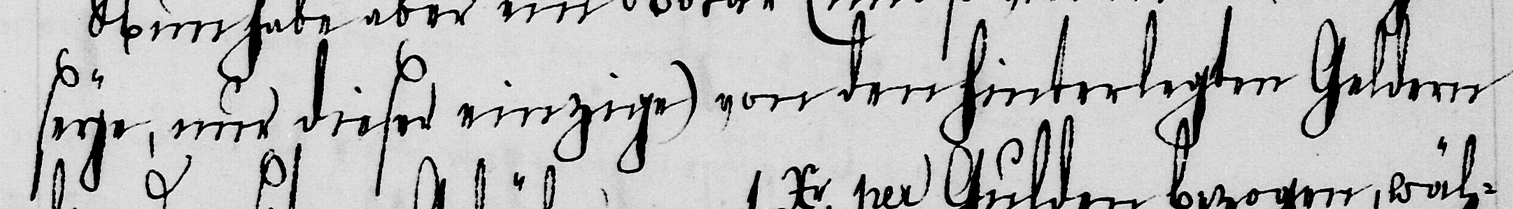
seye, nur dieser einzige) von den hinterlegten Geldern
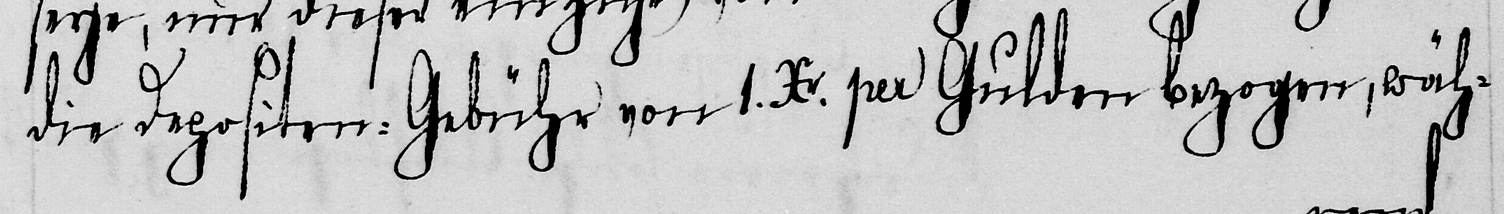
die Depositen-Gebühr von 1. Xr. per Gulden bezogen, wäh-
